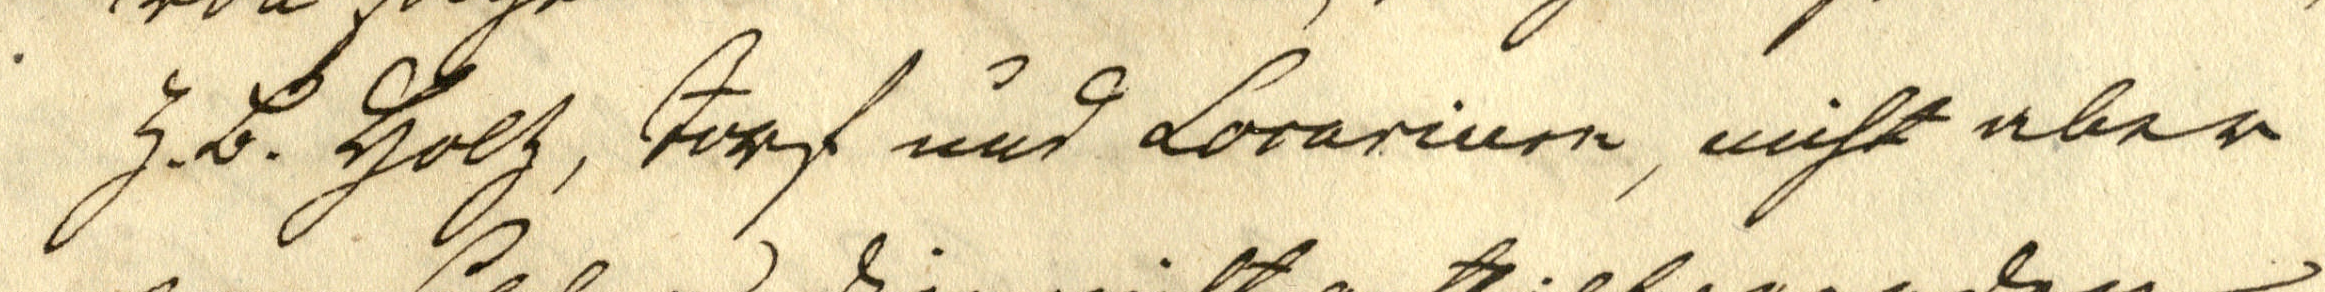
z. B. Holz, Torf und Locarium, nicht aber
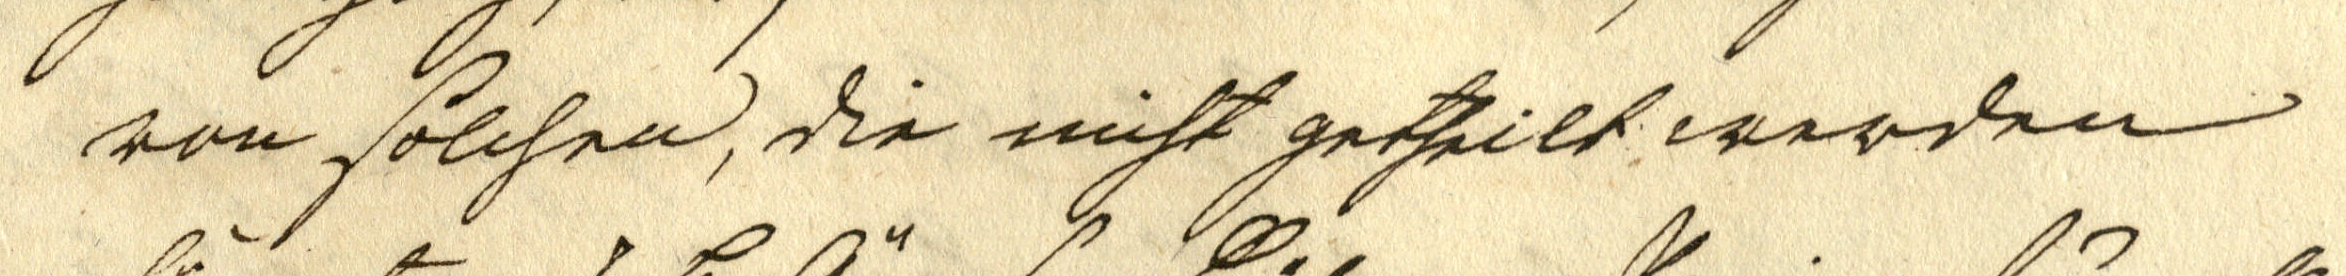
von solchen, die nicht getheilt werden
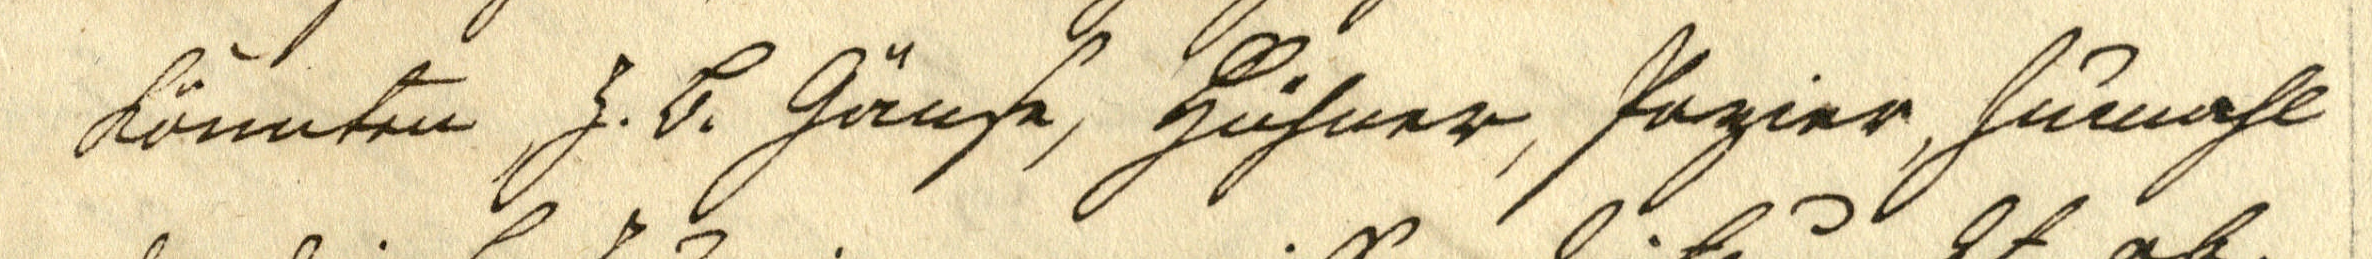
könnten z. B. Gänse, Hühner, Papier, zumahl
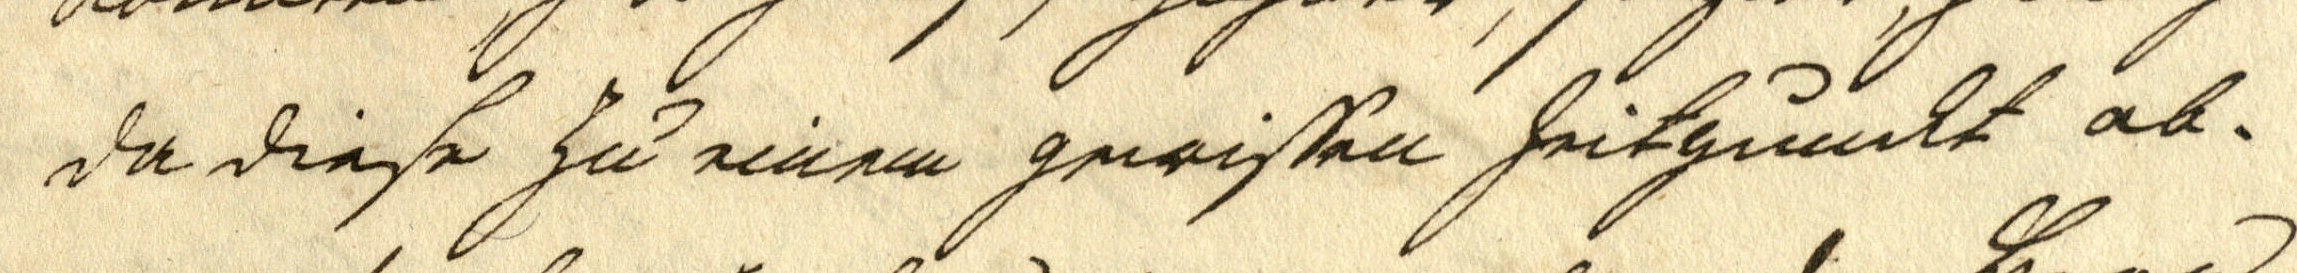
da diese zu einem gewissen Zeitpunckt ab¬
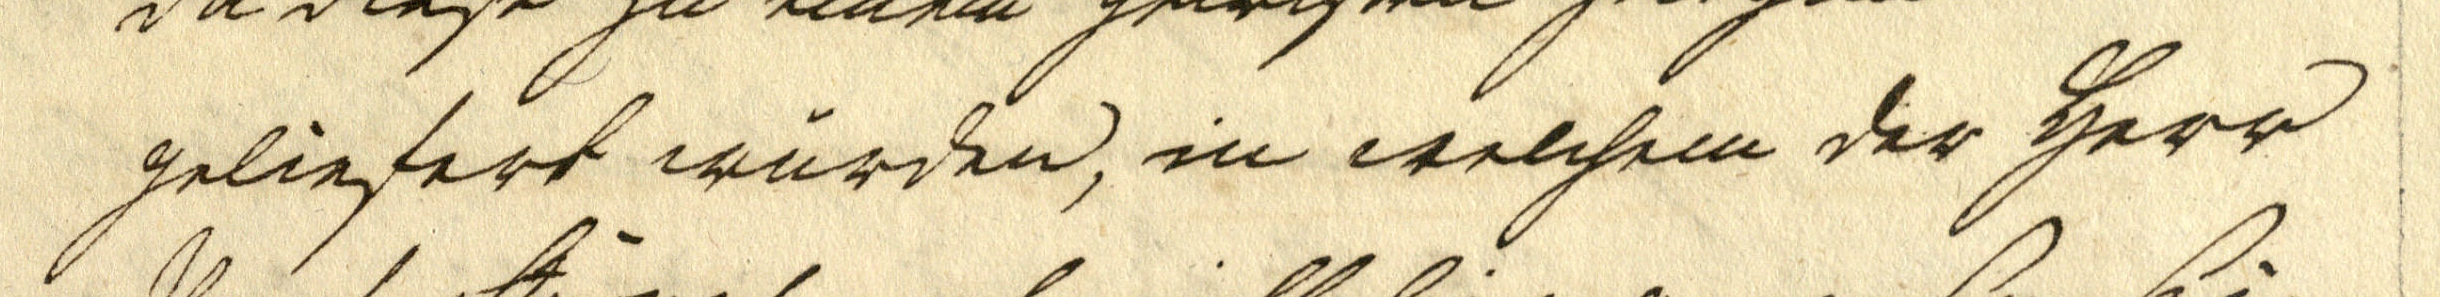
geliefert würden, in welchem der Herr
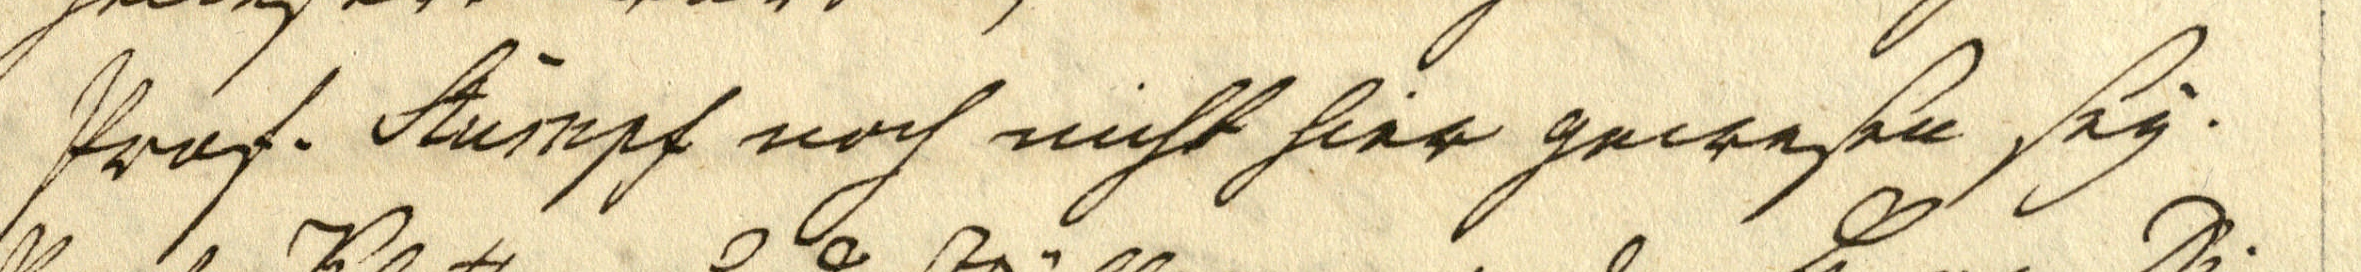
Prof. Stumpf noch nicht hier gewesen seÿ.
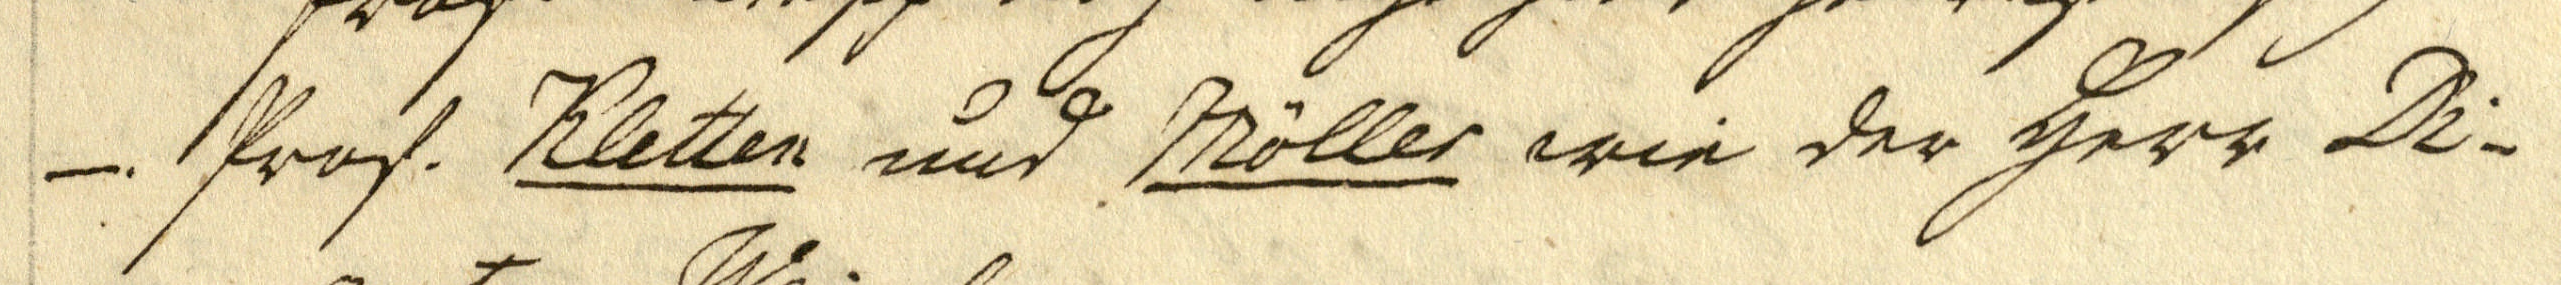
Prof. Kletten und Möller, wie der Herr Di¬
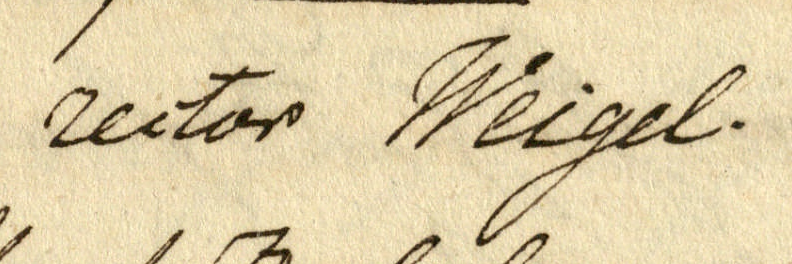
rector Weigel.
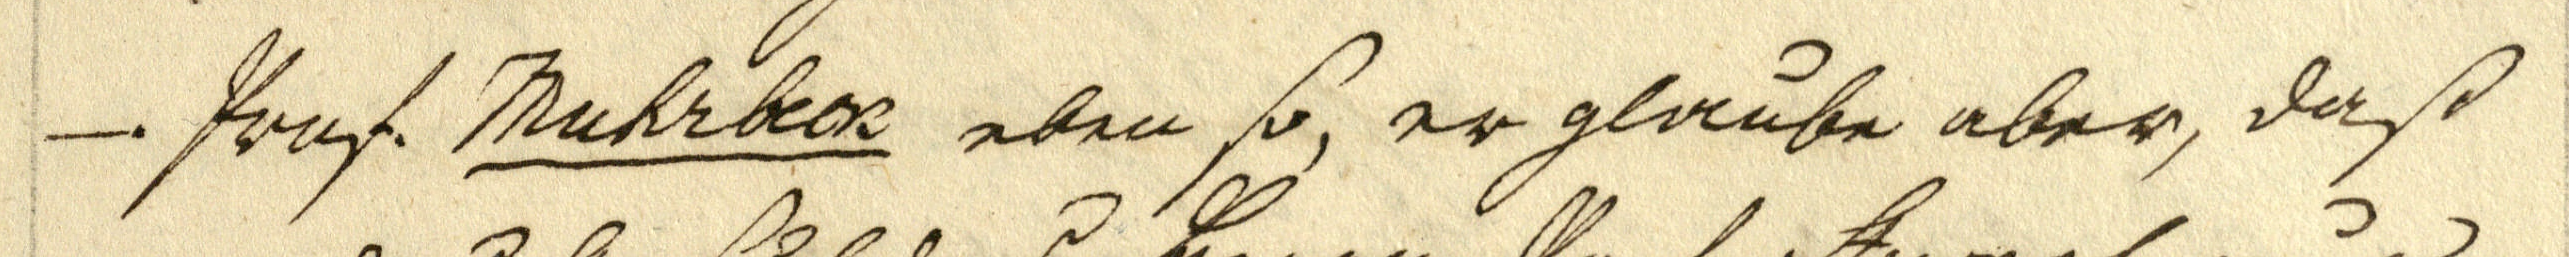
Prof. Muhrbeck eben so, er glaube aber, daß
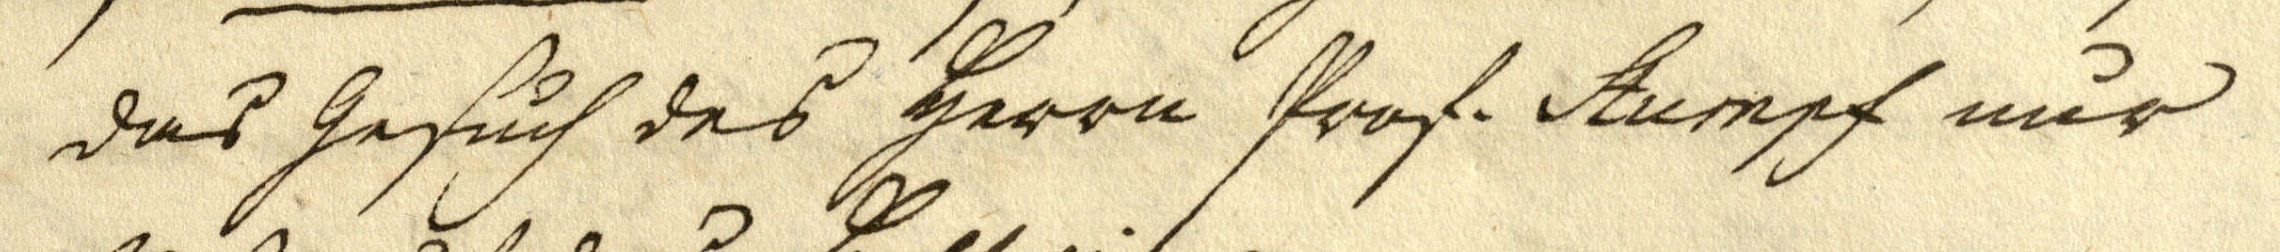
das Gesuch des Herrn Prof. Stumpf nur
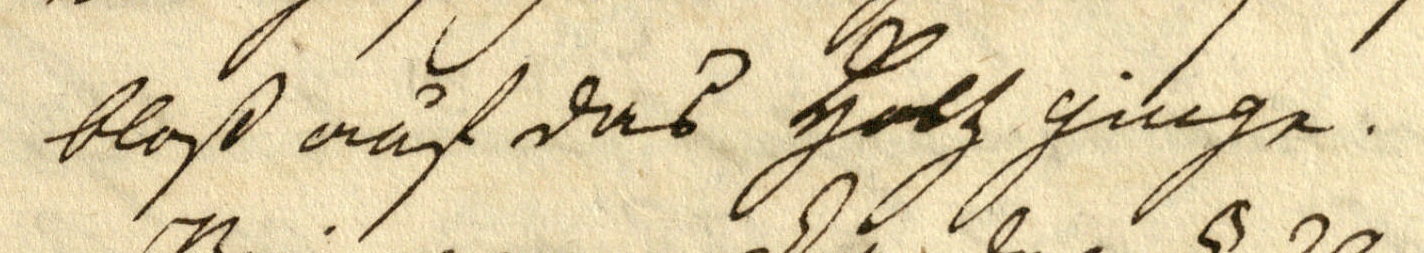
bloß auf das Holz ginge.
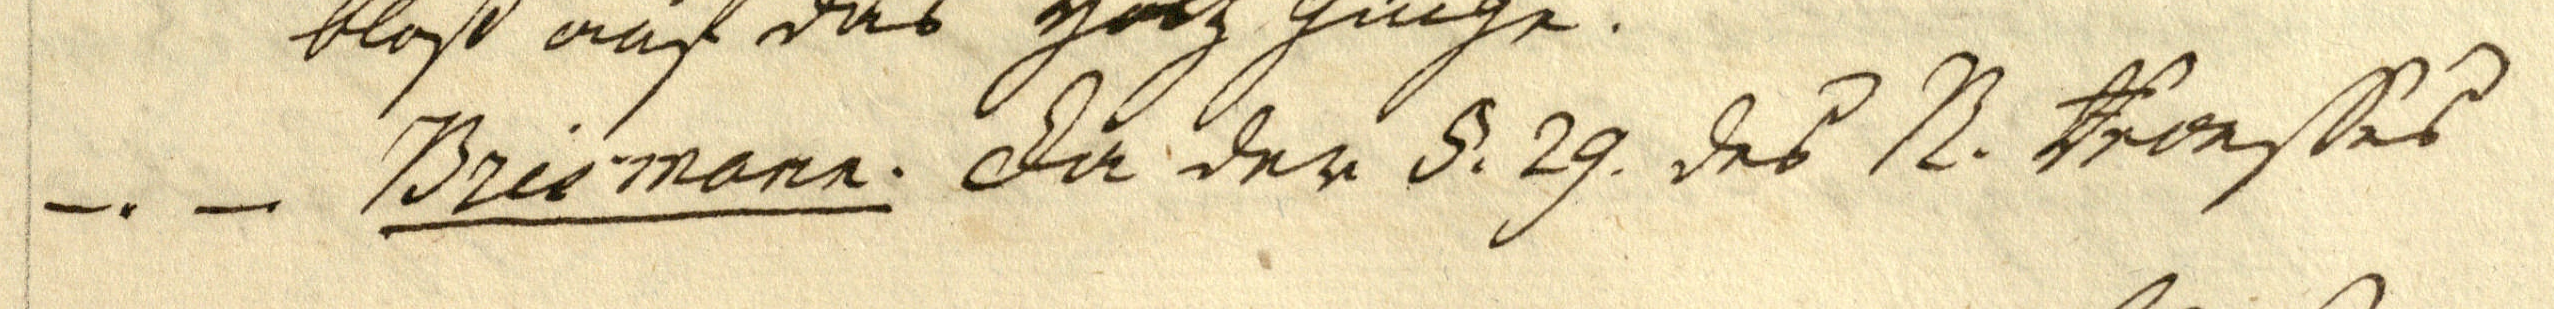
Brismann. Da der §. 29. des N. Recesses
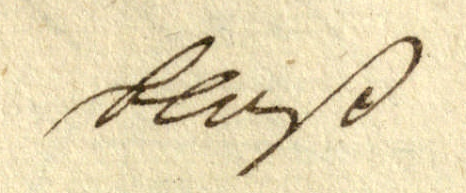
bloß
